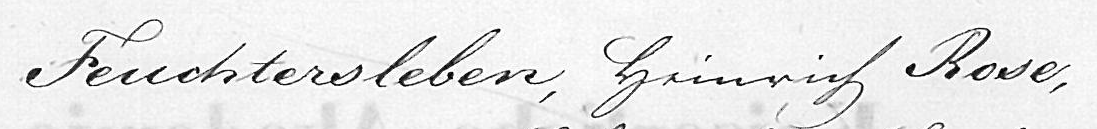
Feuchtersleben, Heinrich Rose,
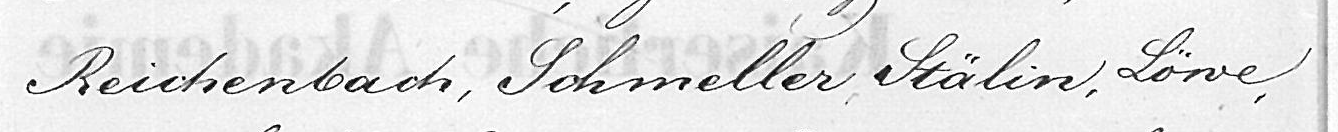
Reichenbach, Schmeller, Stälin, Löwe,
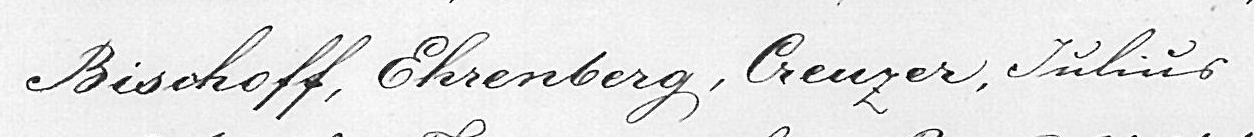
Bischoff, Ehrenberg, Creuzer, Julius
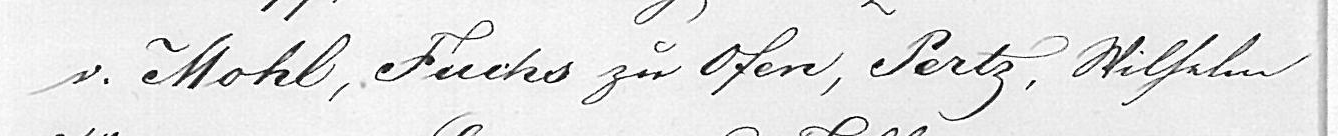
v. Mohl, Fuchs zu Ofen, Pertz, Wilhelm
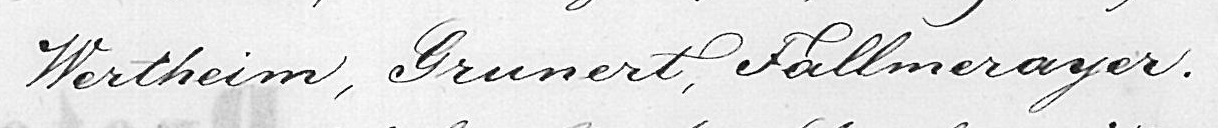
Wertheim, Grunert, Fallmerayer.
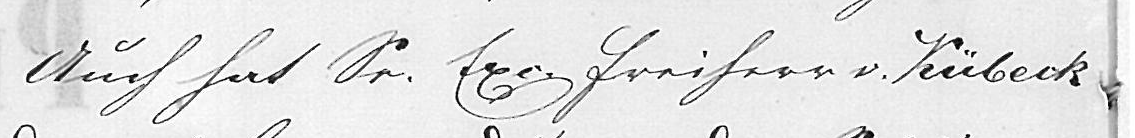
Auch hat Sr. Exc. Freiherr v. Kübeck
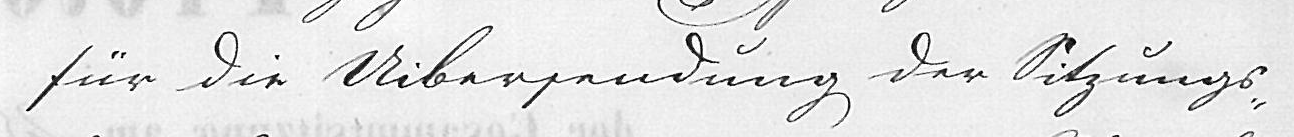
für die Uibersendung der Sitzungs-
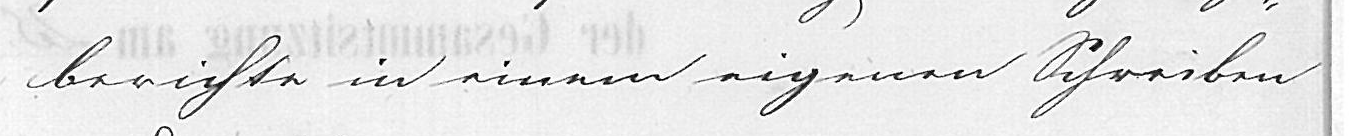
berichte in einem eigenen Schreiben
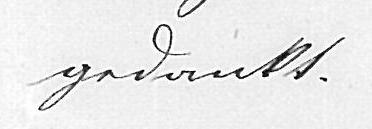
gedankt.
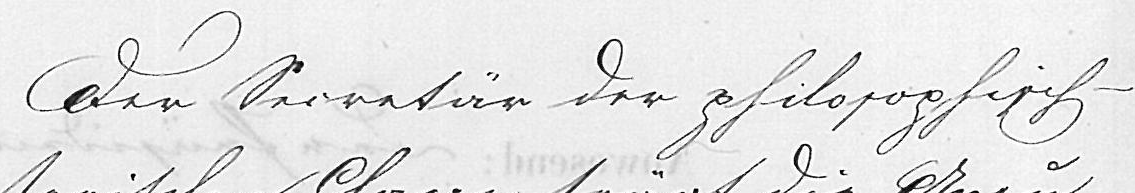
Der Secretär der philosophisch-
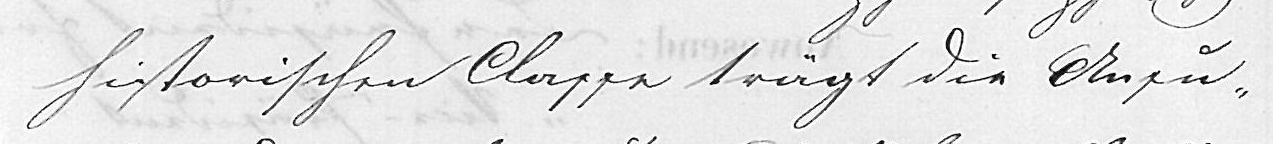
historischen Classe trägt die Ansu-
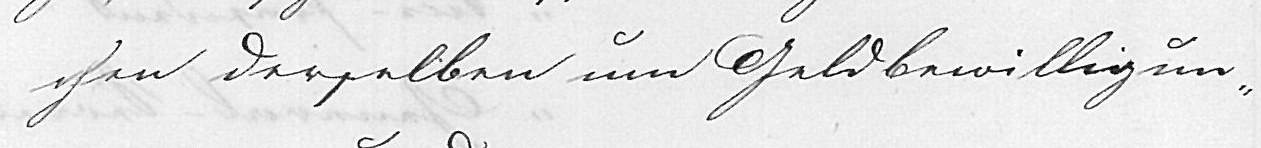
chen derselben und Geldbewilligun-
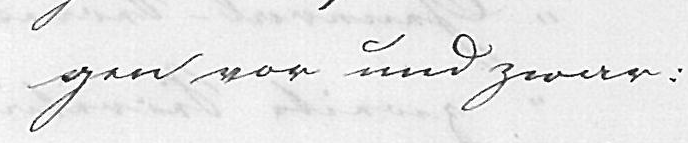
gen vor und zwar:
